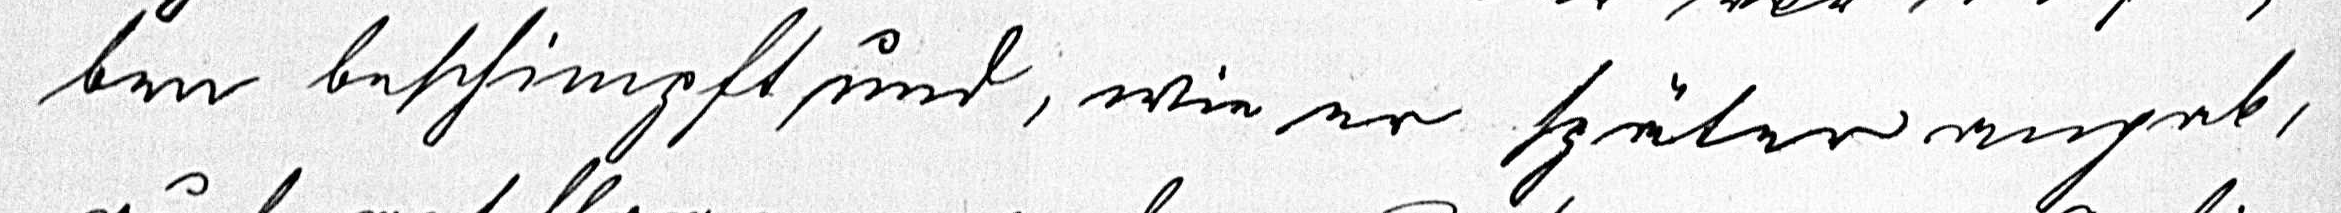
ben beschimpft und, wie er später angab,
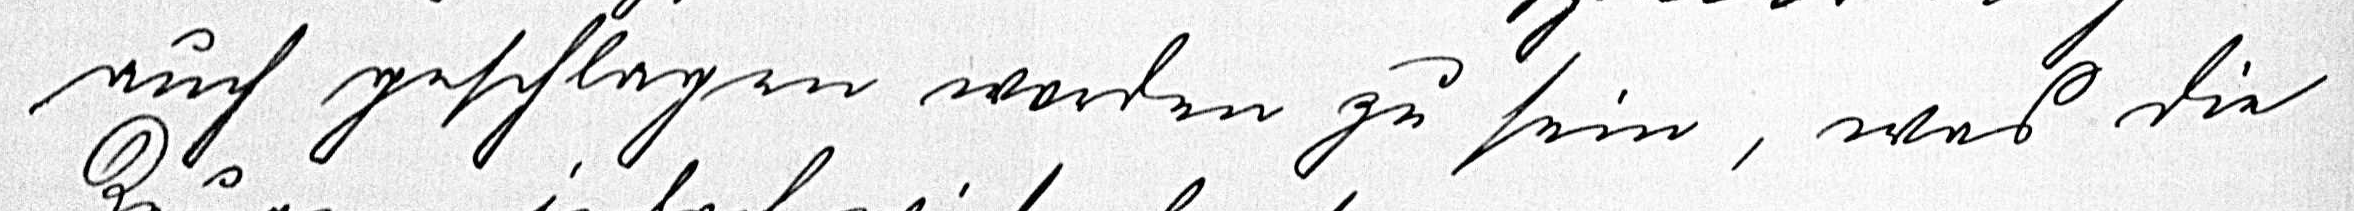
auch geschlagen worden zu sein, was die
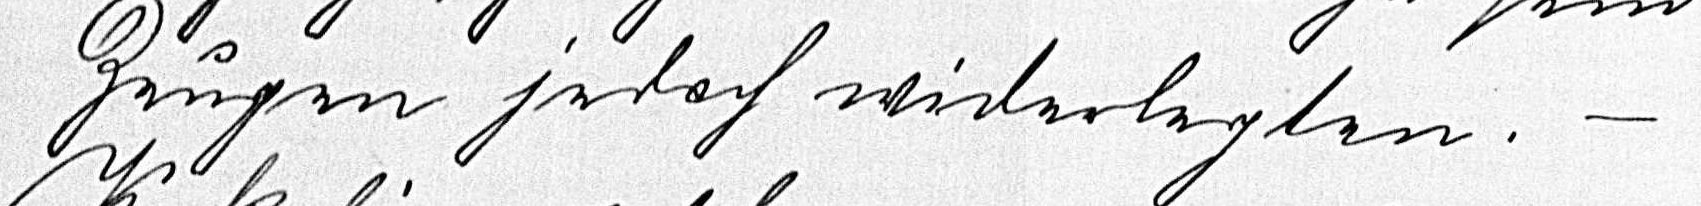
Zeugen jedoch widerlegten.–
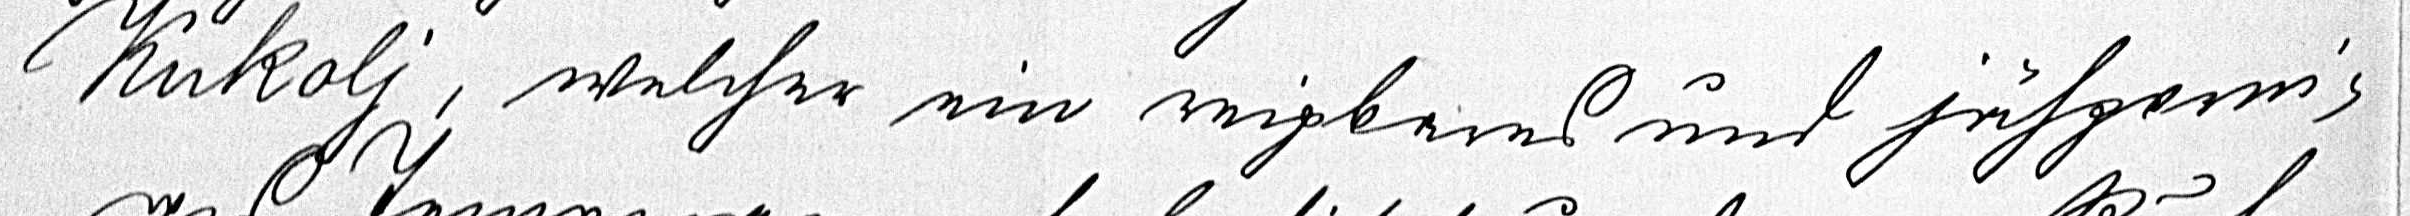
Kukolj, welcher ein reizbares und jähzorni¬
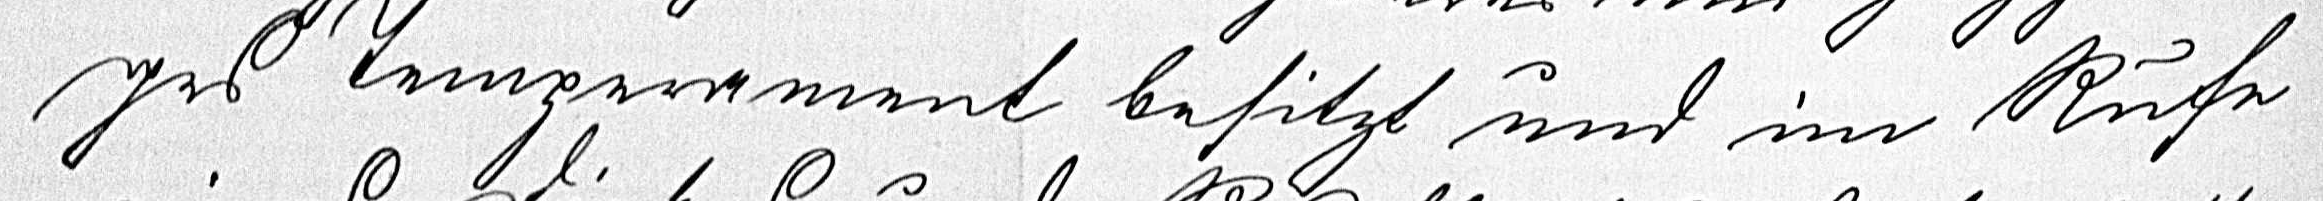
ges Temperament besitzt und im Rufe
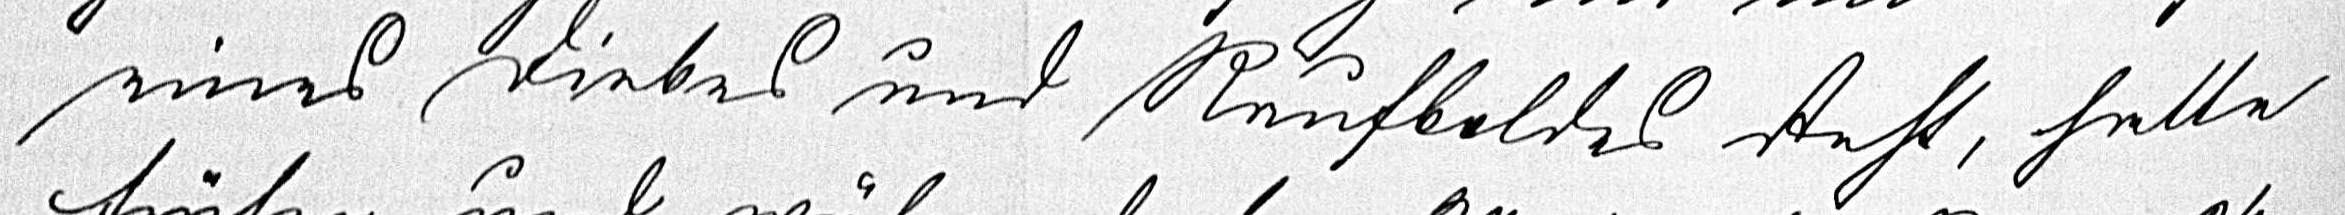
eines Diebes und Raufboldes steht, hatte
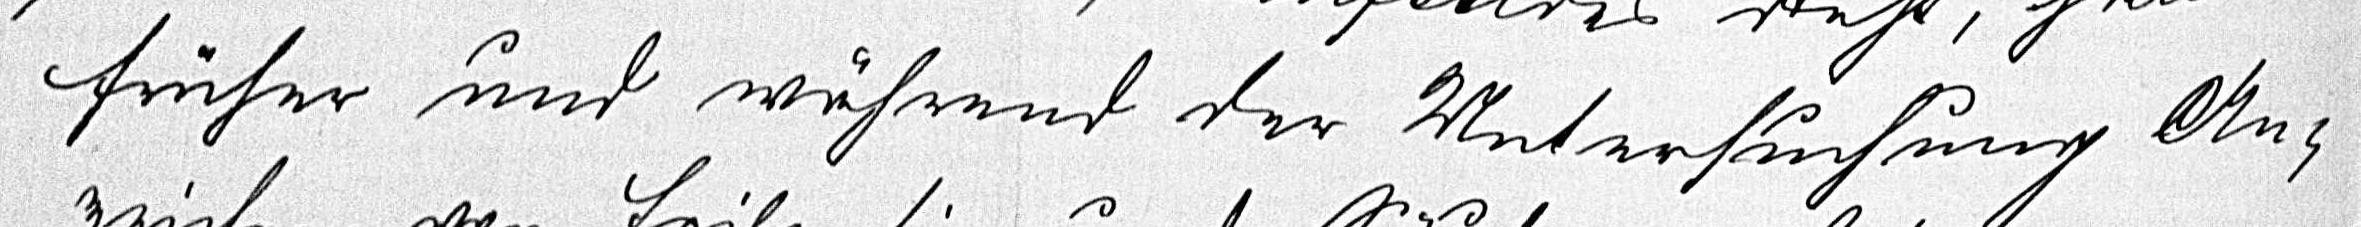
früher und während der Untersuchung An¬
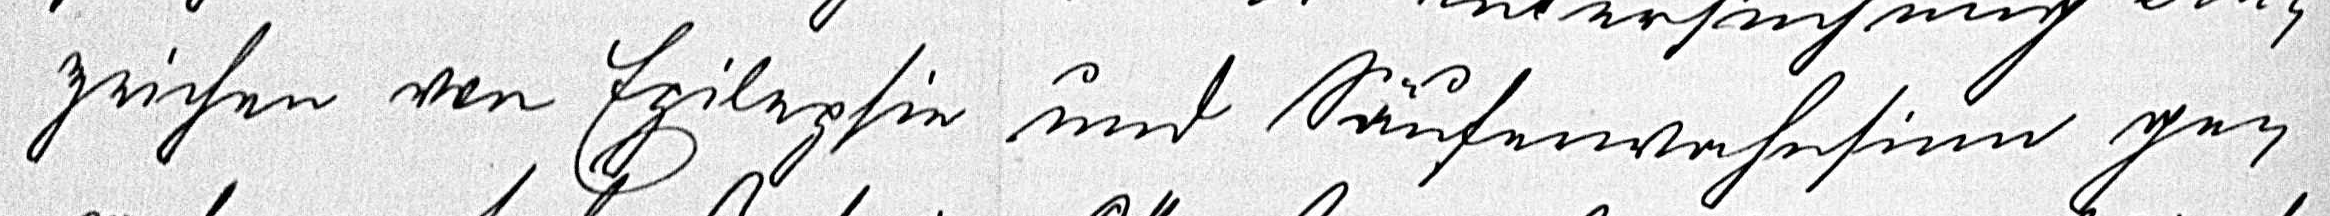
zeichen von Epilepsie und Säufenwahnsinn ge¬
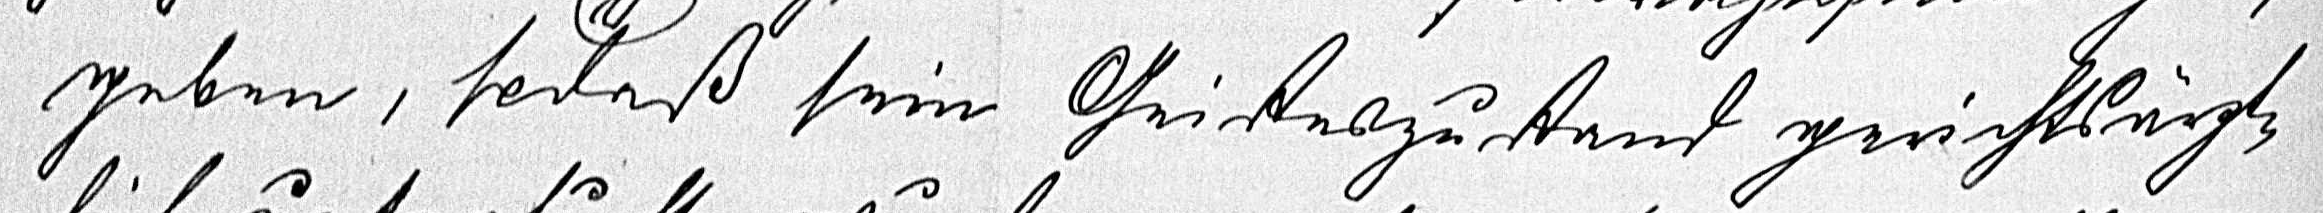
geben, sodaß sein Geisteszustand gerichtsärzt¬
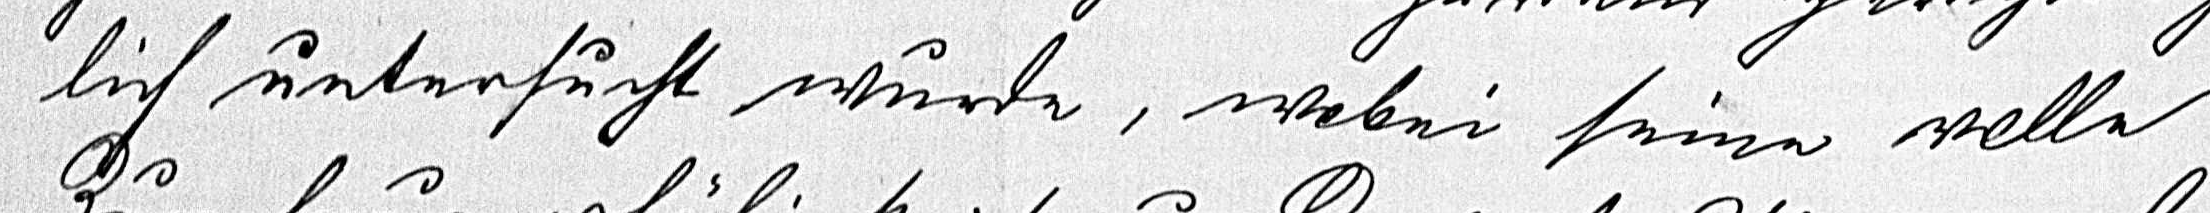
lich untersucht wurde, wobei seine volle
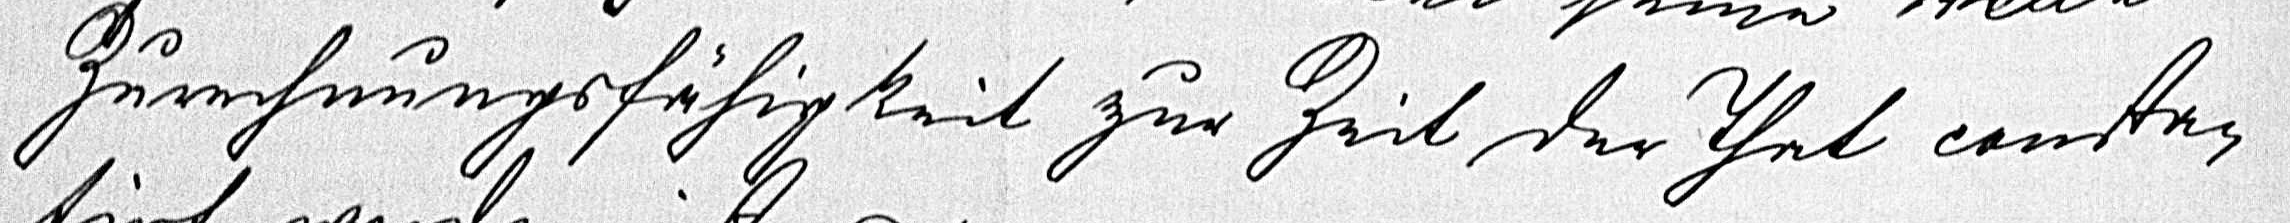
Zurechnungsfähigkeit zur Zeit der That consta¬
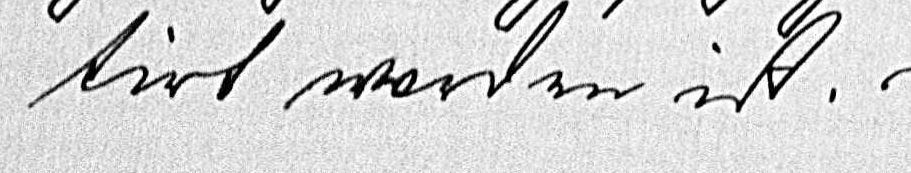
tirt werden ist.
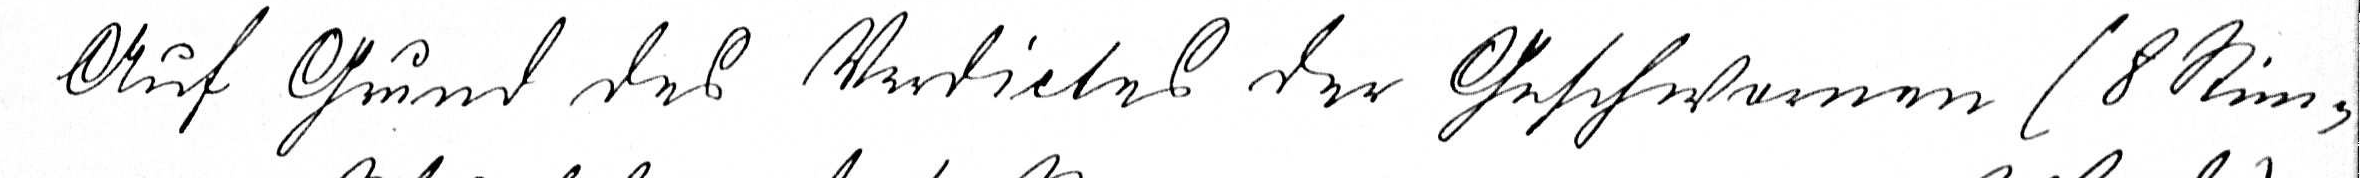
Auf Grund des Verdictes der Geschwornen (8 Stim¬
